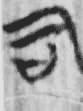司
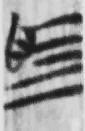馬
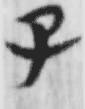子
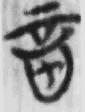音
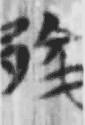○（蔡）
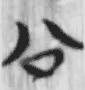公
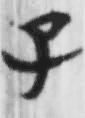子
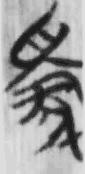○（家）
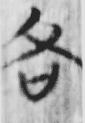各
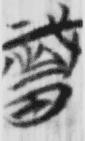戠
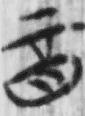酉（酒）
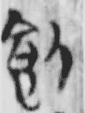○（食）
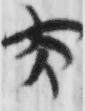夫
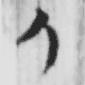人
